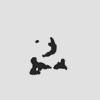失
